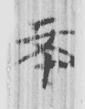不
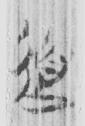道
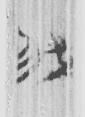我
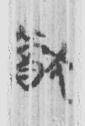猶
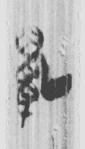{鼠一}
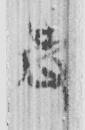皮
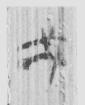{戈一}
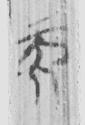而
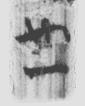{廿一}
